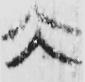大
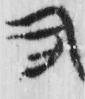司
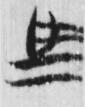馬
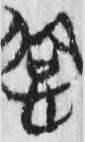○（悼）
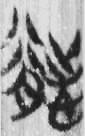○（滑）
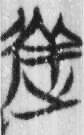𨒫（將）
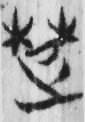楚
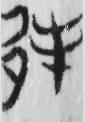邦
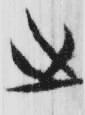之
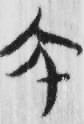帀（師）
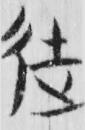徒
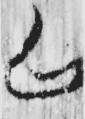㠯（以）
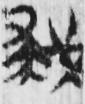○（救）
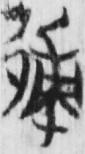郙
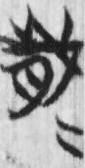歲
